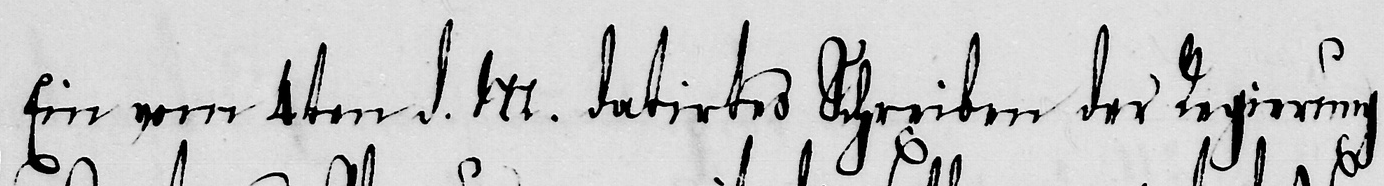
Ein vom 4ten d. M. datirtes Schreiben der Regierung
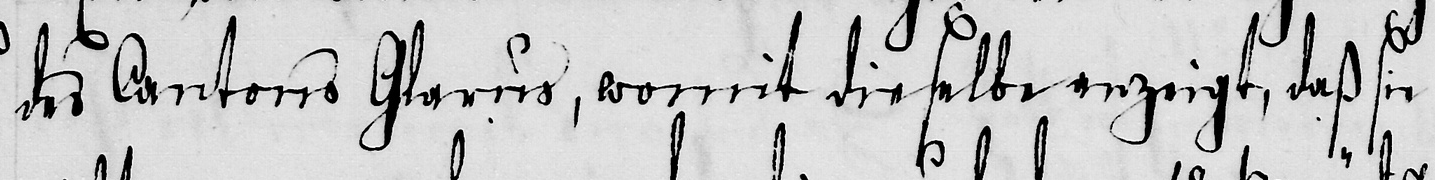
des Cantons Glarus, womit dieselbe anzeigt, daß sie
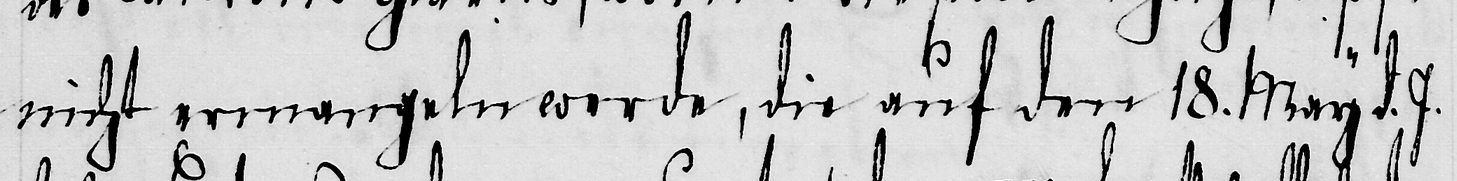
nicht ermangeln werde, die auf den 18. May d.
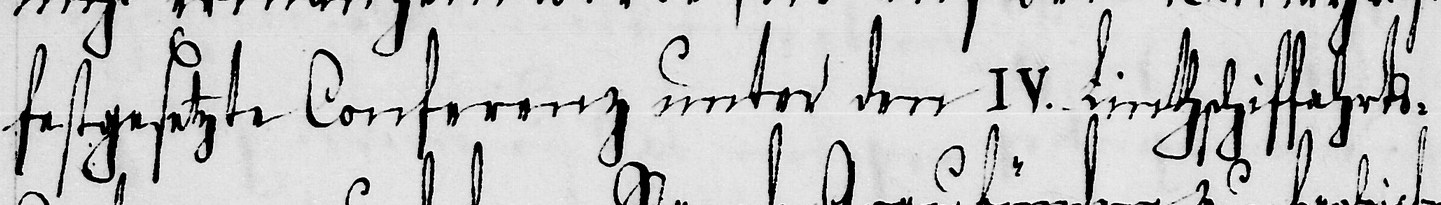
estgesetzte Conferenz unter den IV. Linthschiffah¬
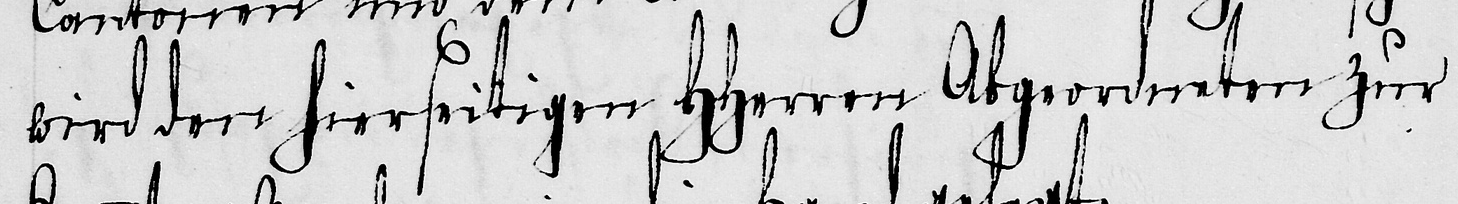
wird den hierseitigen HHerren Abgeordneten zur
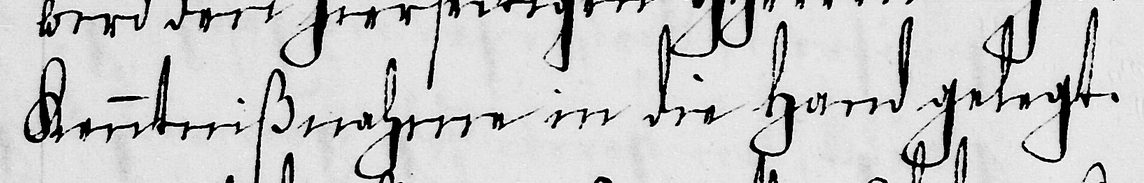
Kenntnißnahme in die Hand gelegt.
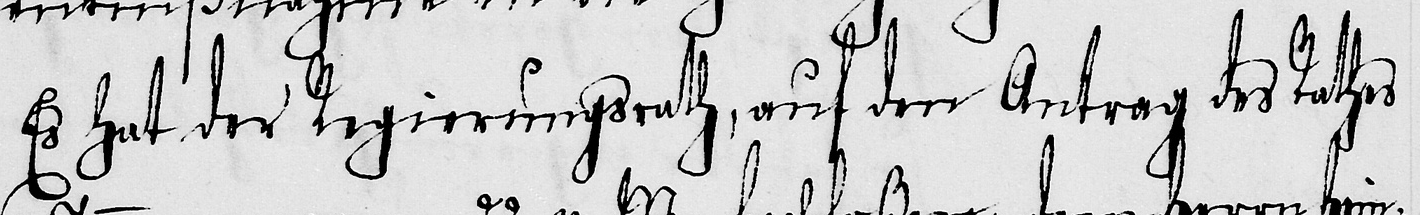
Es hat der Regierungsrath, auf den Antrag des Rath¬
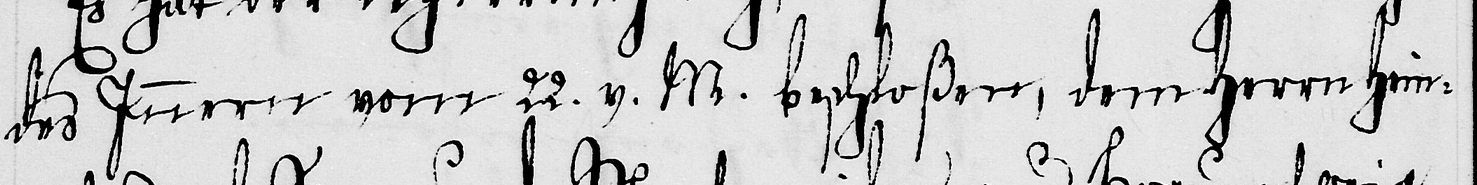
des Innern vom 22. v. M. beschloßen, dem Herrn Hein¬
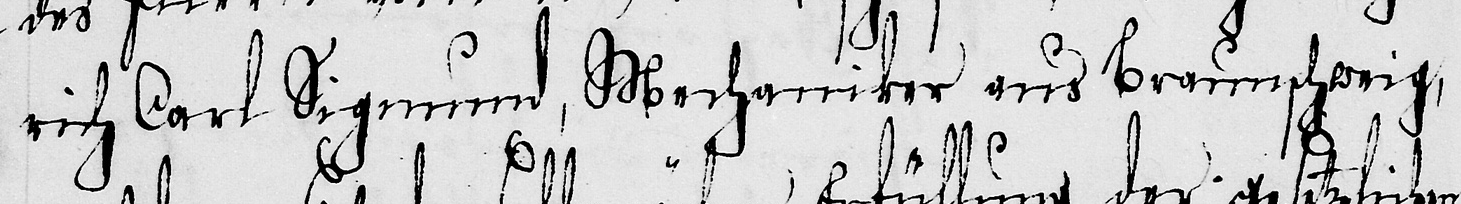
rich Carl Sigmund, Mechaniker aus Braunschweig,
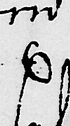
es
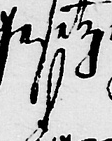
täti¬
